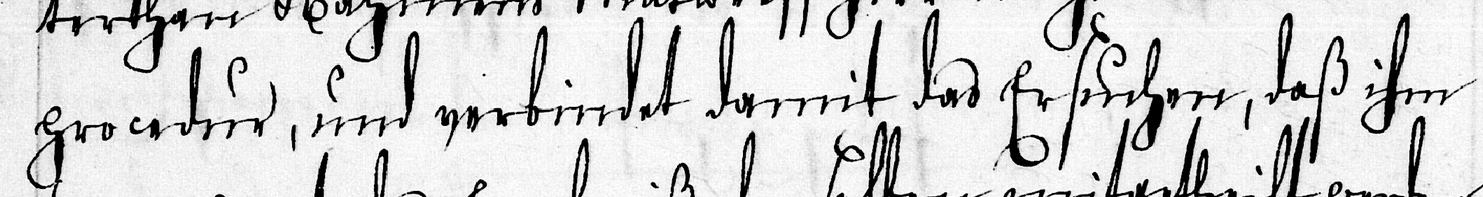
lprocedur, und verbindet damit das Ersuchen, daß ihm
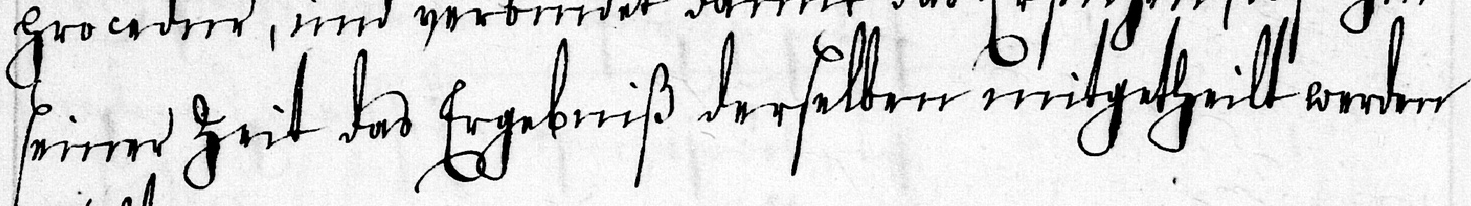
seiner Zeit das Ergebniß derselben mitgetheilt werden
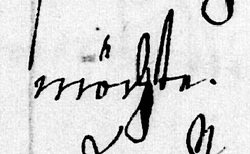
möchte.
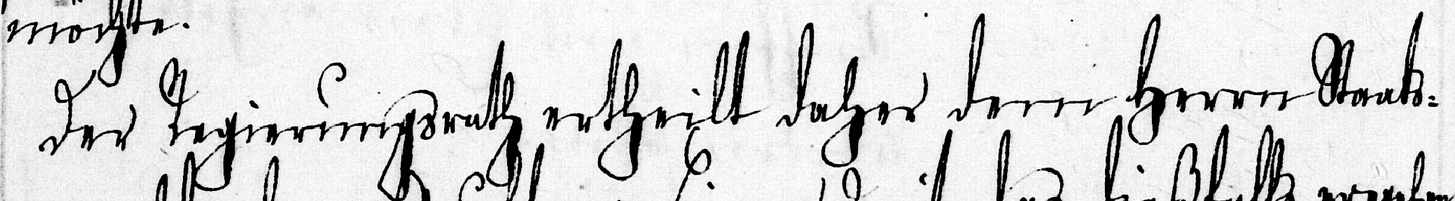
Der Regierungsrath ertheilt daher dem Herrn Staat¬
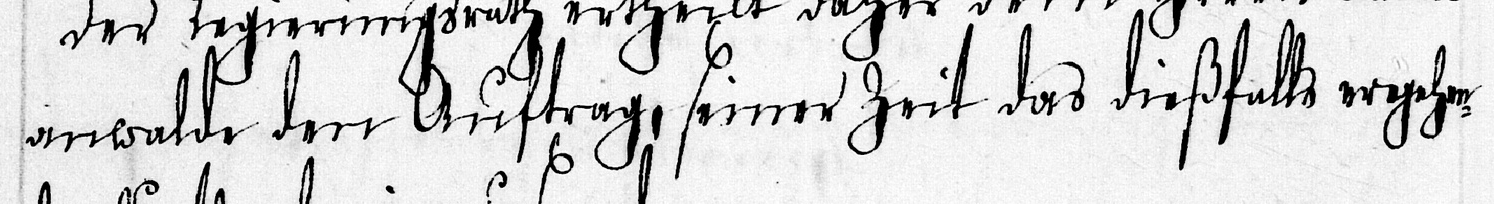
sanwalde den Auftrag, seiner Zeit das dießfalls ergehe¬
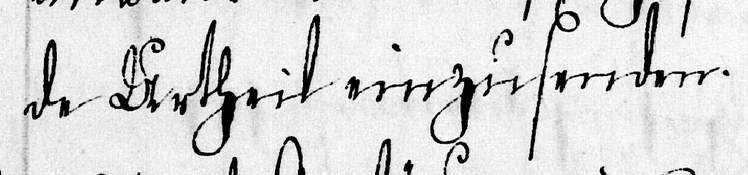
nde Urtheil einzusenden.
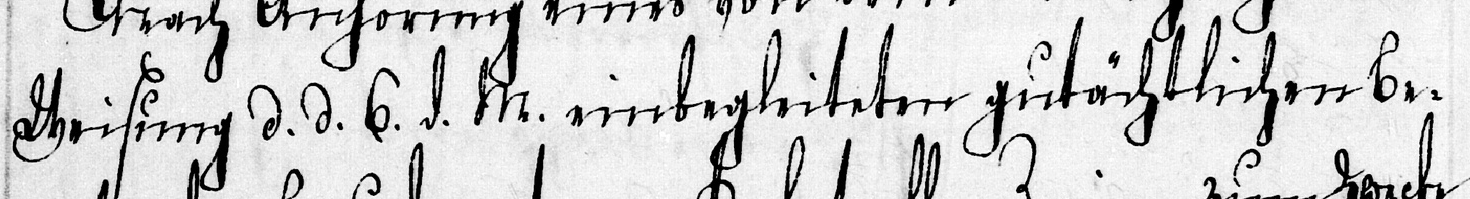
Weisung d. d. 6. d. M. eingeleiteten gutächtlichen Be¬
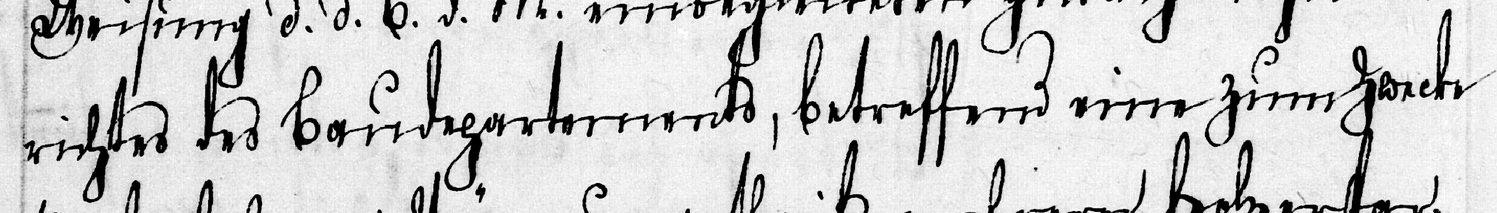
richtes des Baudepartements, betreffend eine zum Zwecke
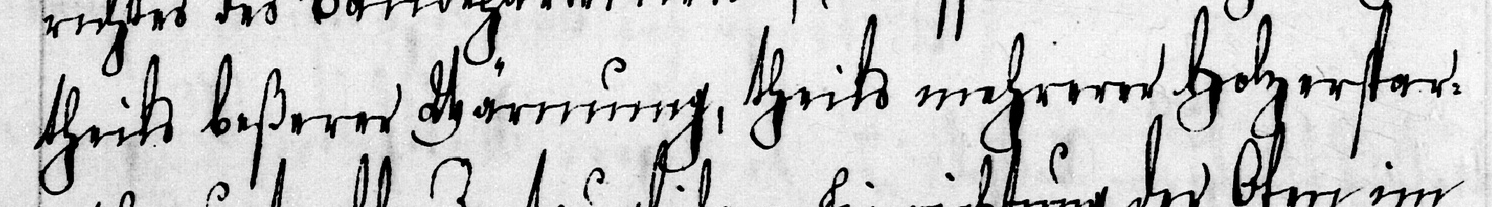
theils beßerer Wärmung, theils mehrerer Holzerspar¬
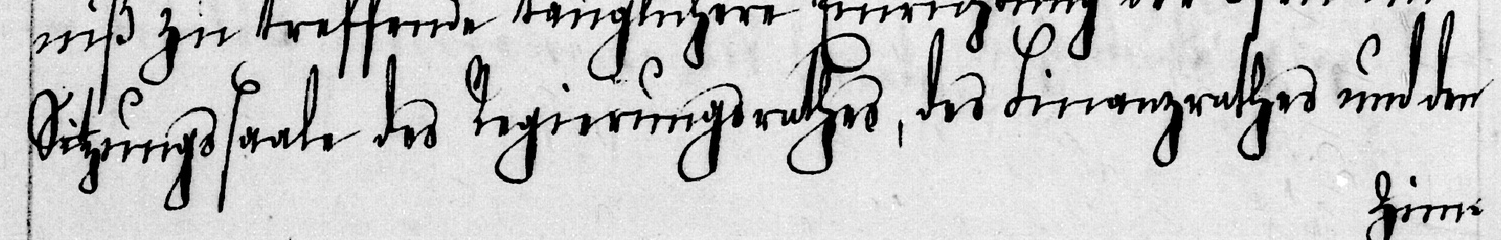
Sitzungssaale des Regierungsrathes, des Finanzrathes und der
